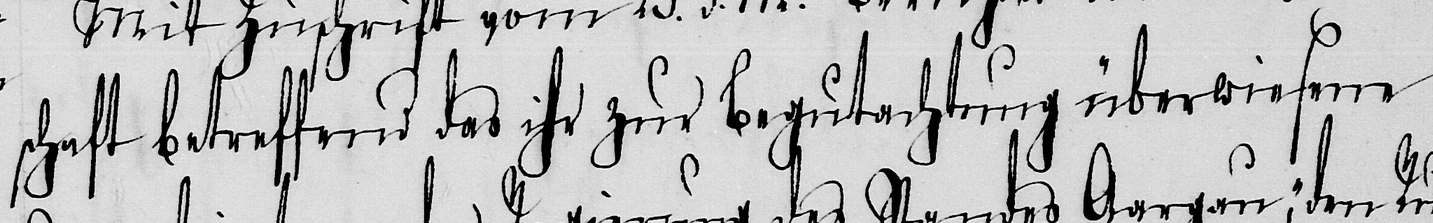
chaft betreffend des ihr zur Begutachtung überwiesene
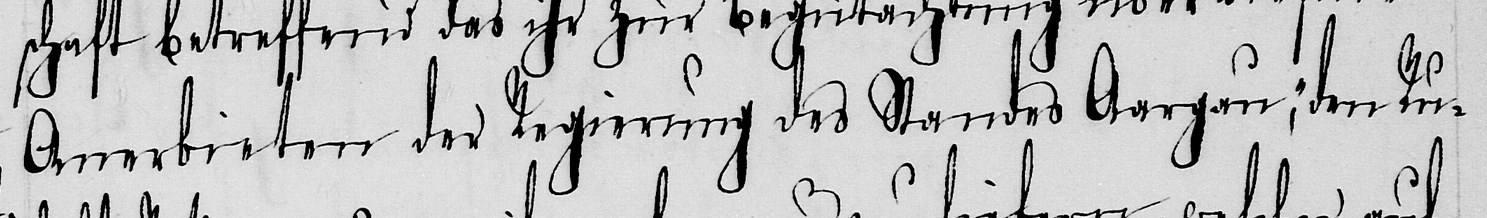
Anerbieten der Regierung des Standes Aargau, „den Ru¬
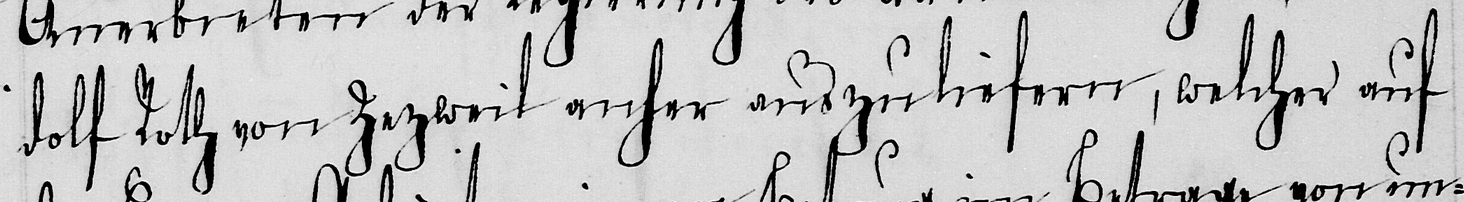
dolf Roth von Zezweil anher auszuliefern, welcher auf
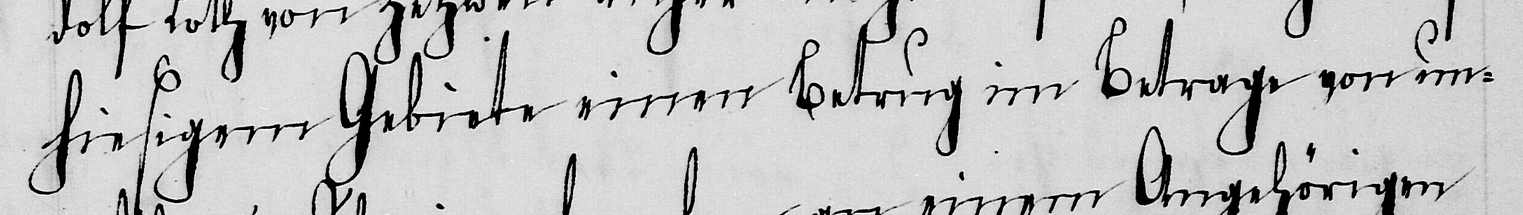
hiesigem Gebiete einen Betrug im Betrage von un¬
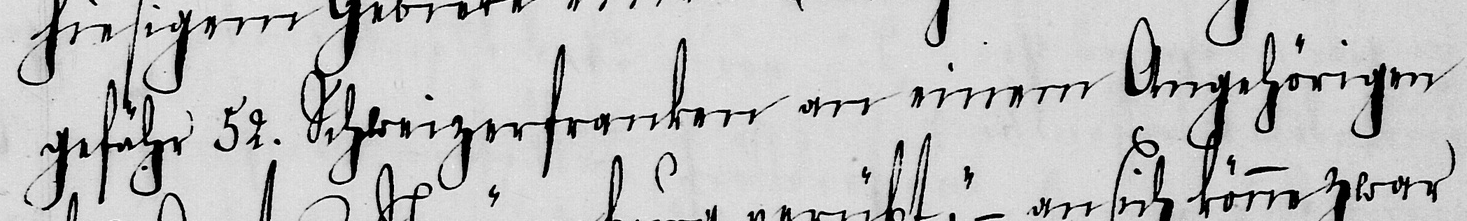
gefähr 52. Schweizerfranken an einem Angehörigen
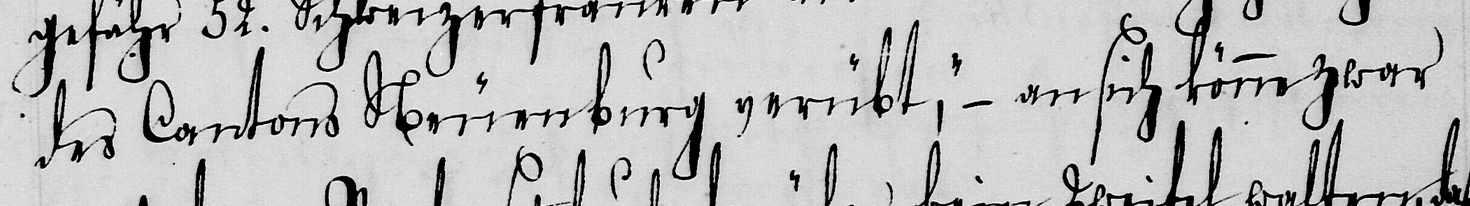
des Cantons Neuenburg verübt“, – an sich könne zwar
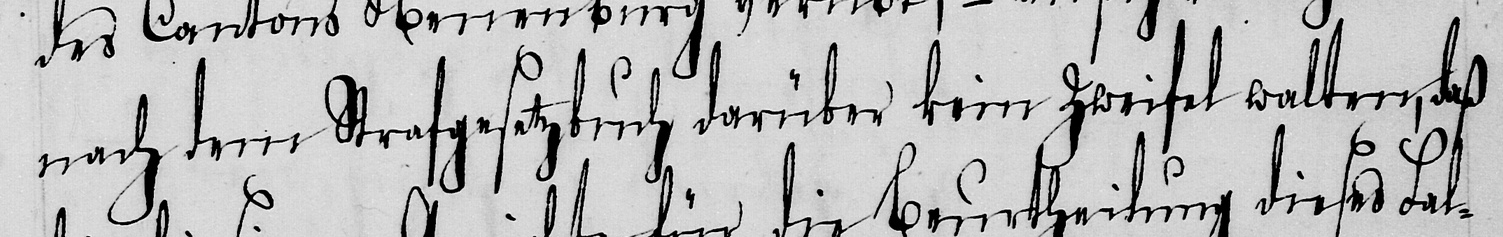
nach dem Strafgesetzbuch darüber kein Zweifel walten, daß
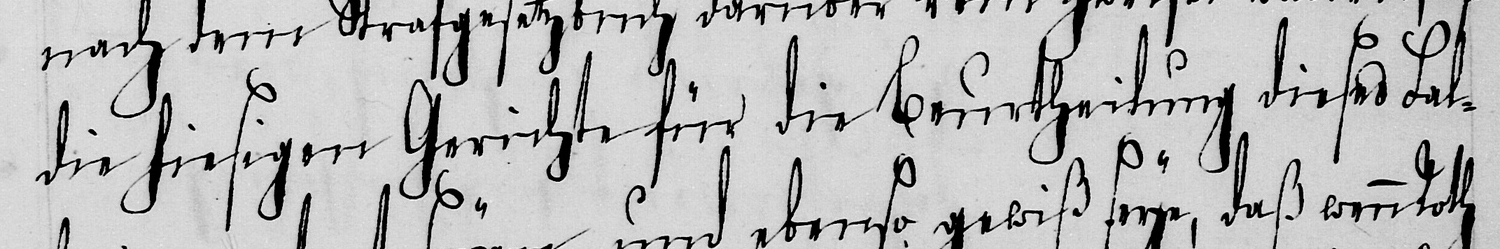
die hiesigen Gerichte für die Beurtheilung dieses Fal¬
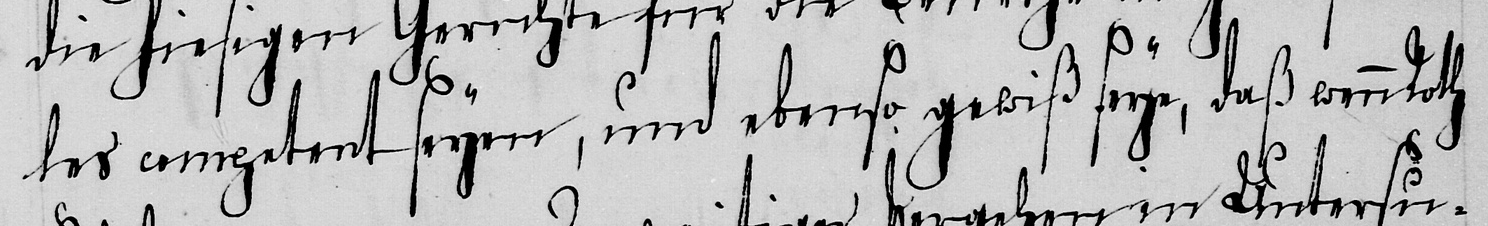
les competent seyen, und ebenso gewiß seye, daß wenn Roth
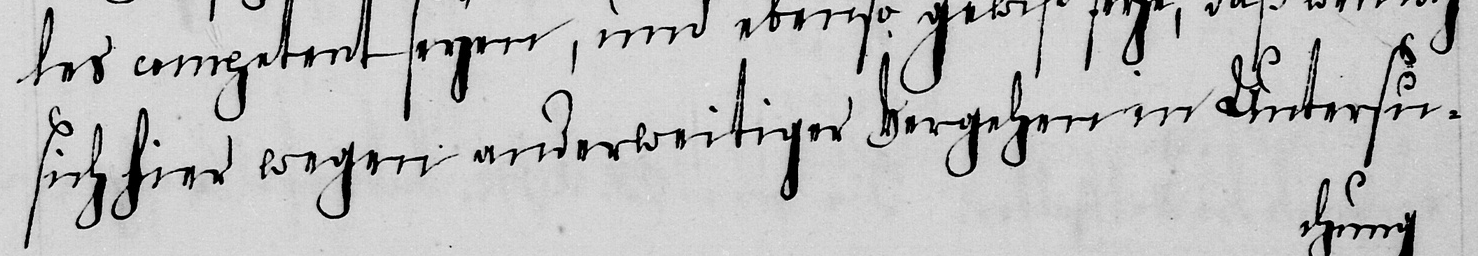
sich hier wegen anderweitiger Vergehen in Untersu-
